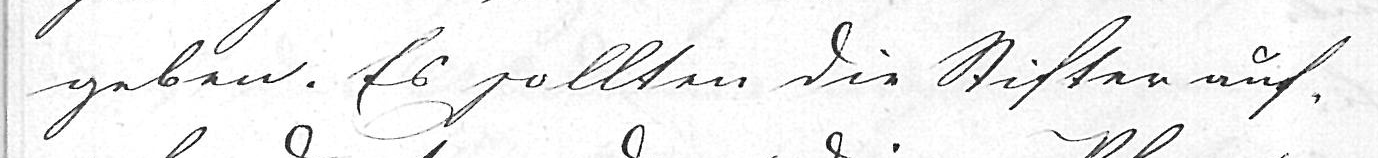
geben. Es sollten die Stifter auf-
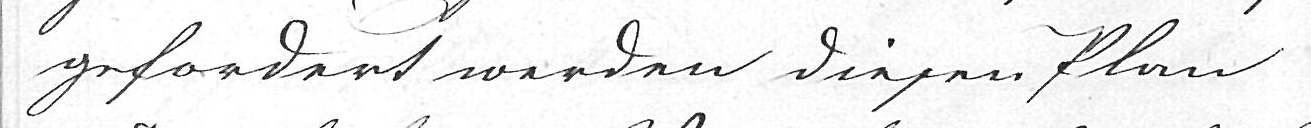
gefordert werden diesen Plan
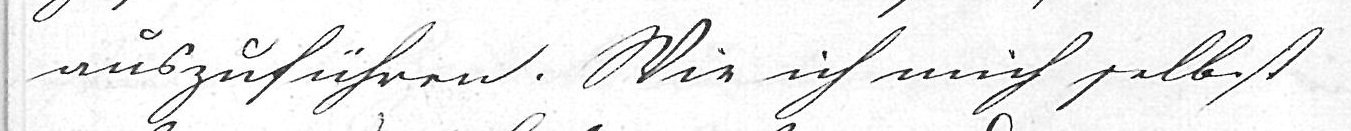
auszuführen. Wie ich mich selbst
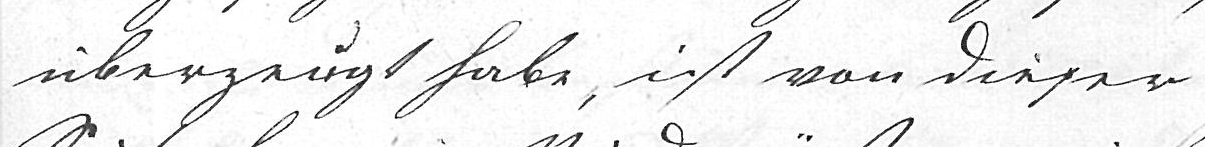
überzeugt habe, ist von dieser
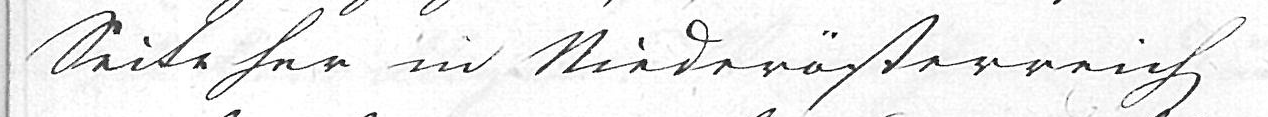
Seite her in Niederösterreich
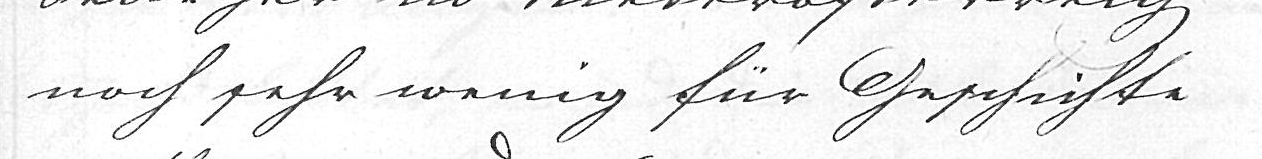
noch sehr wenig für Geschichte
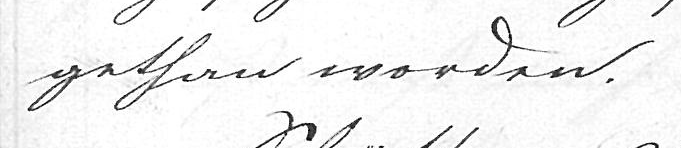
gethan worden.
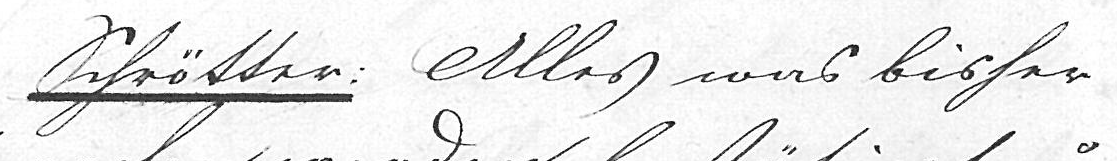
Schrötter: Alles was bisher
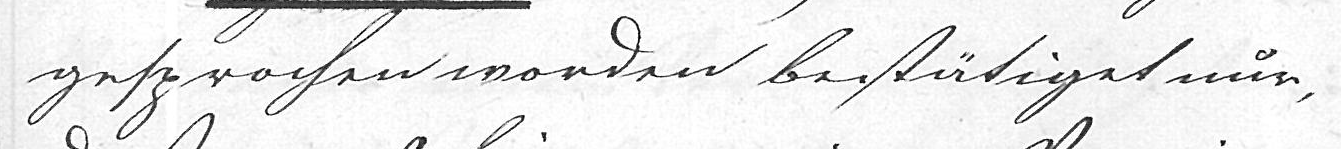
gesprochen worden bestätiget nur,
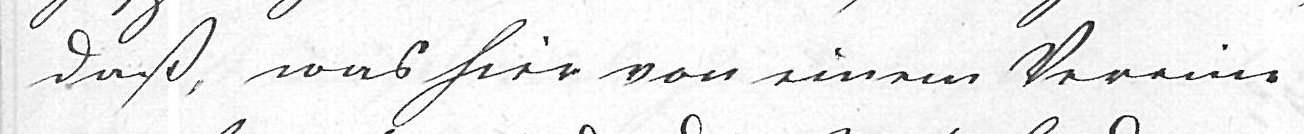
daß, was hier von einem Vereine
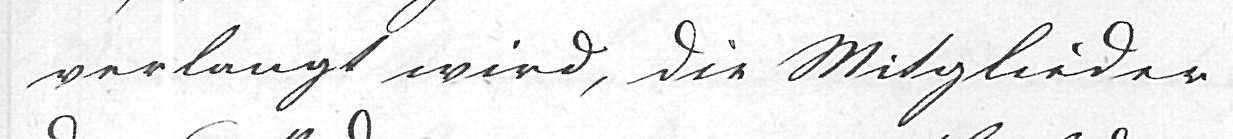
verlangt wird, die Mitglieder
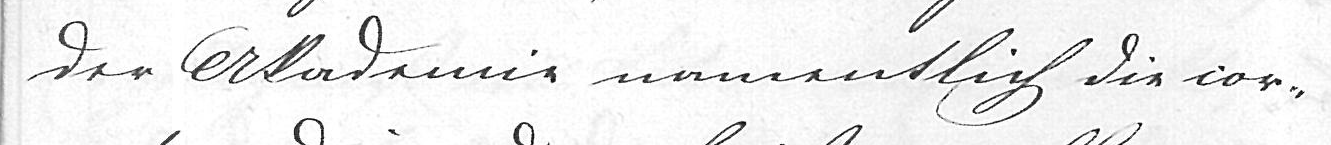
der Akademie namentlich die cor-
